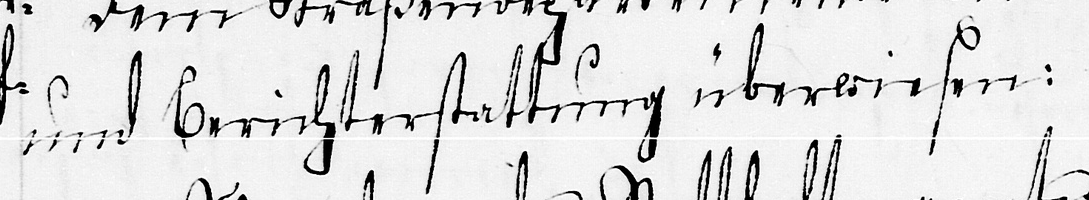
und Berichterstattung überwiesen:
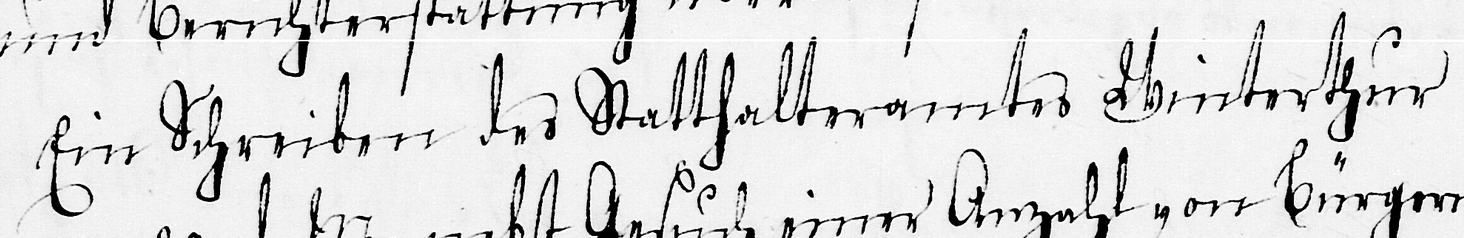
Ein Schreiben des Statthalteramtes Winterthur
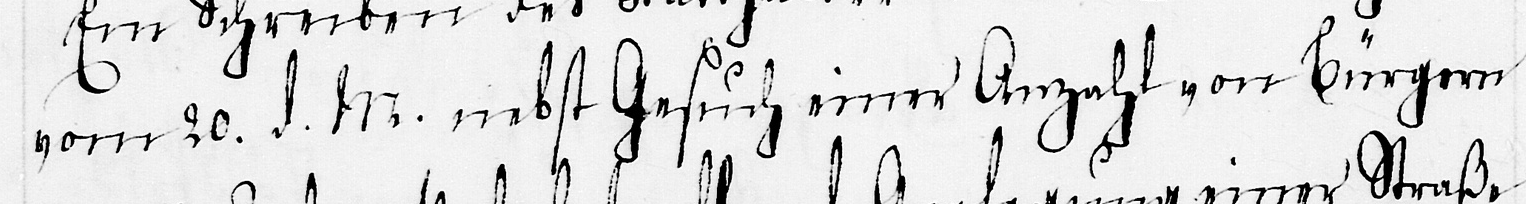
vom 20. d. M. nebst Gesuch einer Anzahl von Bürgern
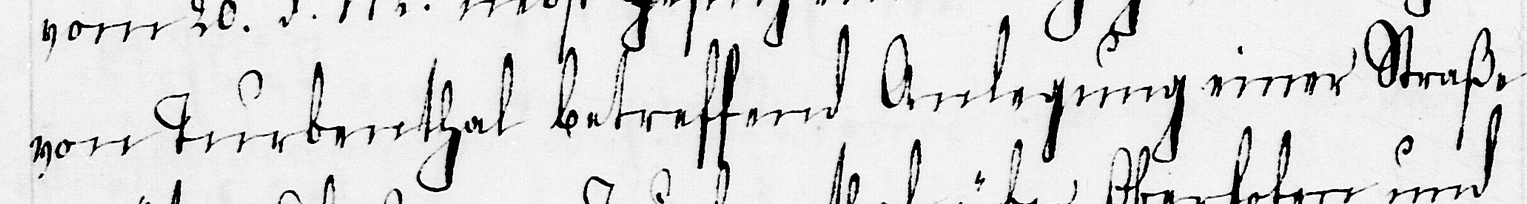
von Turbenthal betreffend Anlegung einer Straße
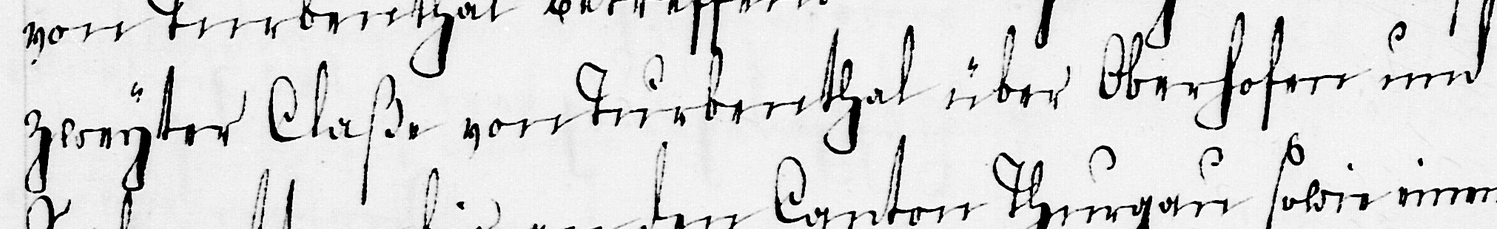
zweyter Claße von Turbenthal über Oberhofen und
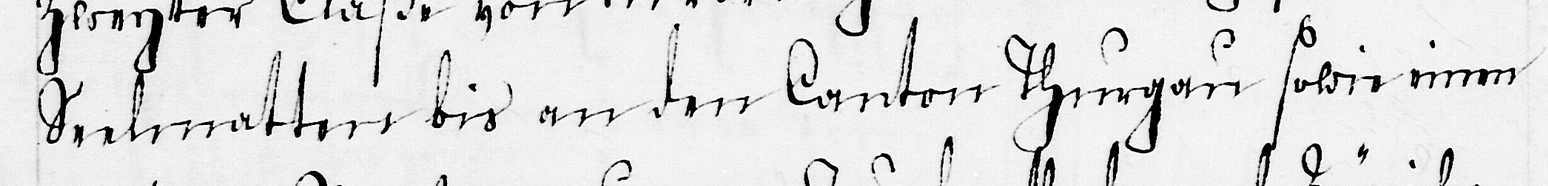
Seelmatten bis an den Canton Thurgau sowie einen
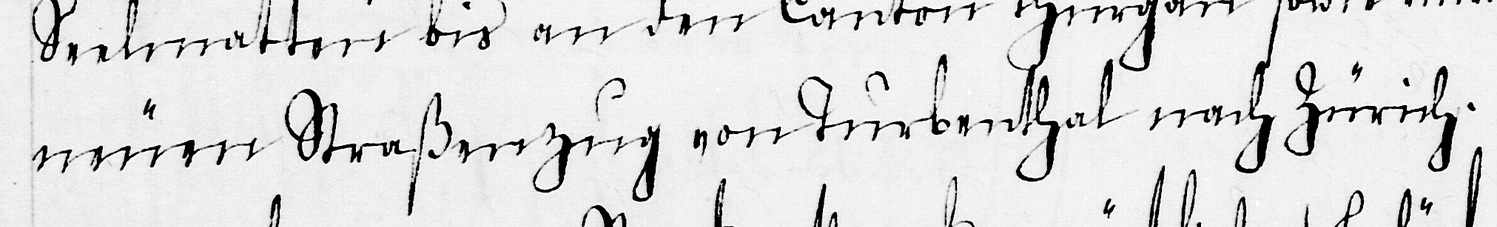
neuen Straßenzug von Turbenthal nach Zürich.
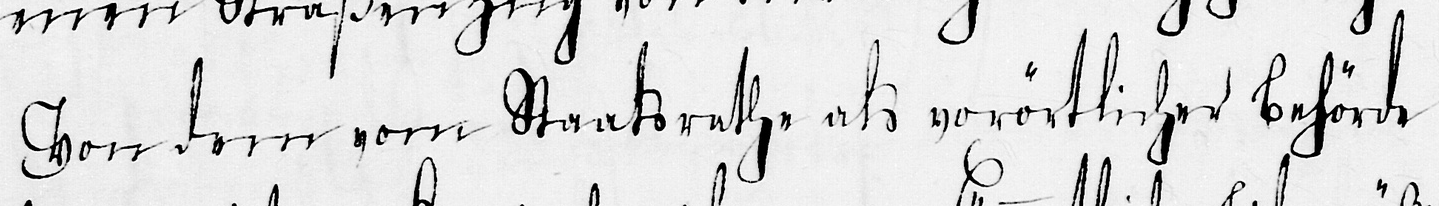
Von dem vom Staatsrathe als vorörtlicher Behörde
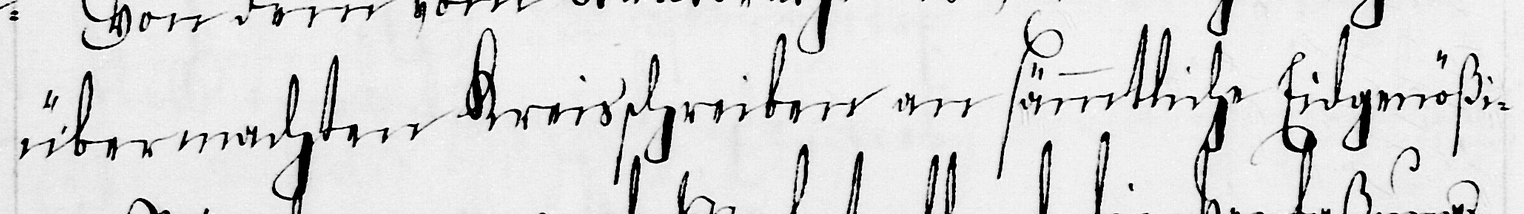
übermachten Kreisschreiben an sämmtliche Eidgenößi¬
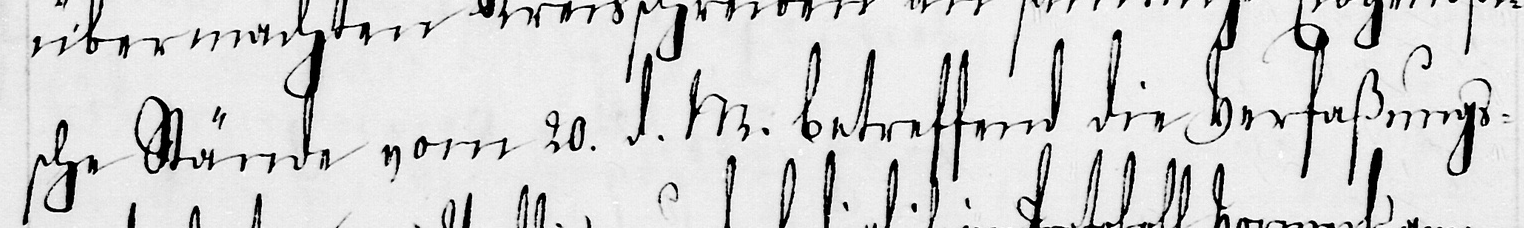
sche Stände vom 20. d. M. betreffend die Verfaßungs¬
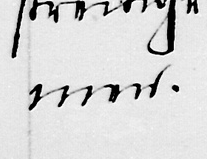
men.
